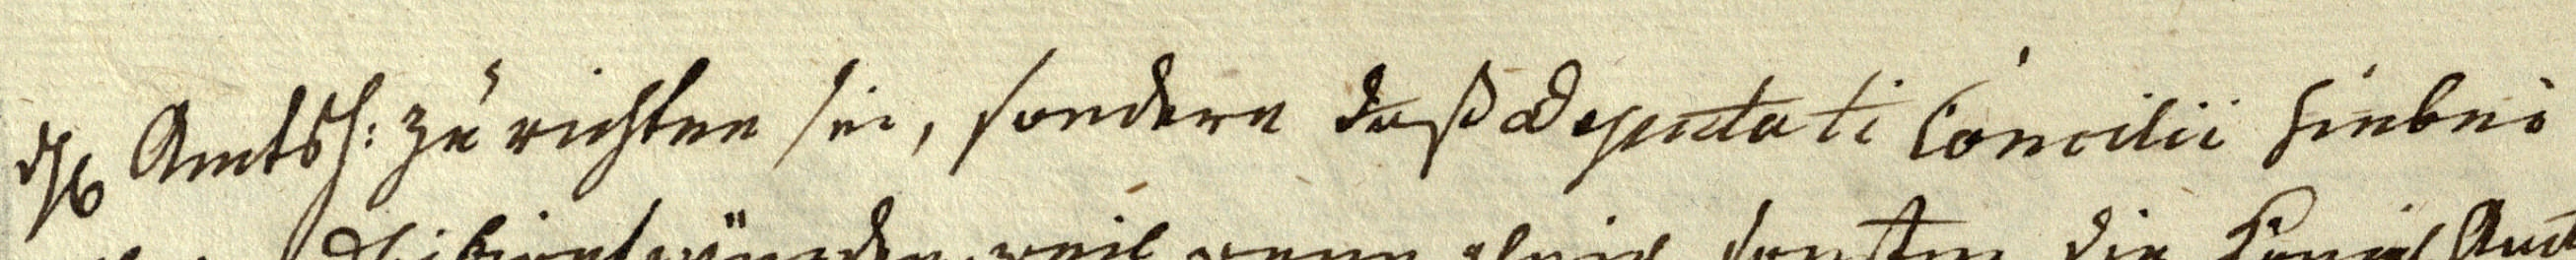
dh. Amtsh. zu richten sei, sondern daß Deputati Concilii hiebei
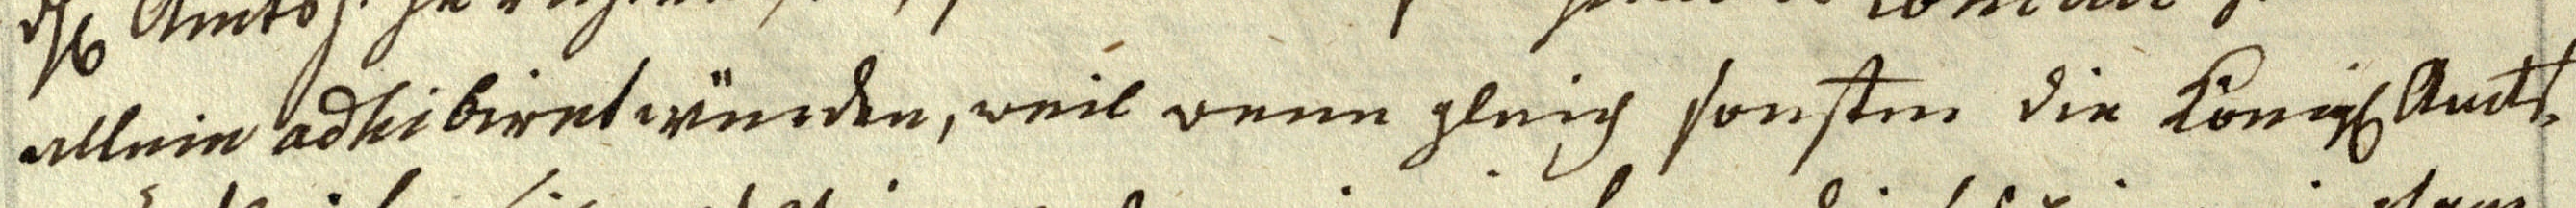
allein adhibiret würden, weil wenn gleich sonsten die Königl. Amts¬
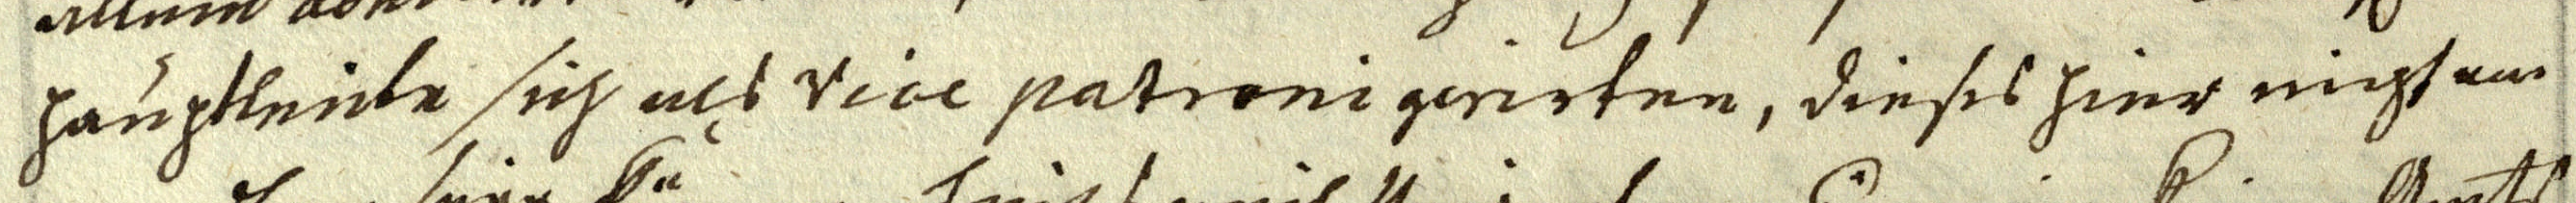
hauptleute sich als Vice patroni gerirten, dieses hier nicht an¬
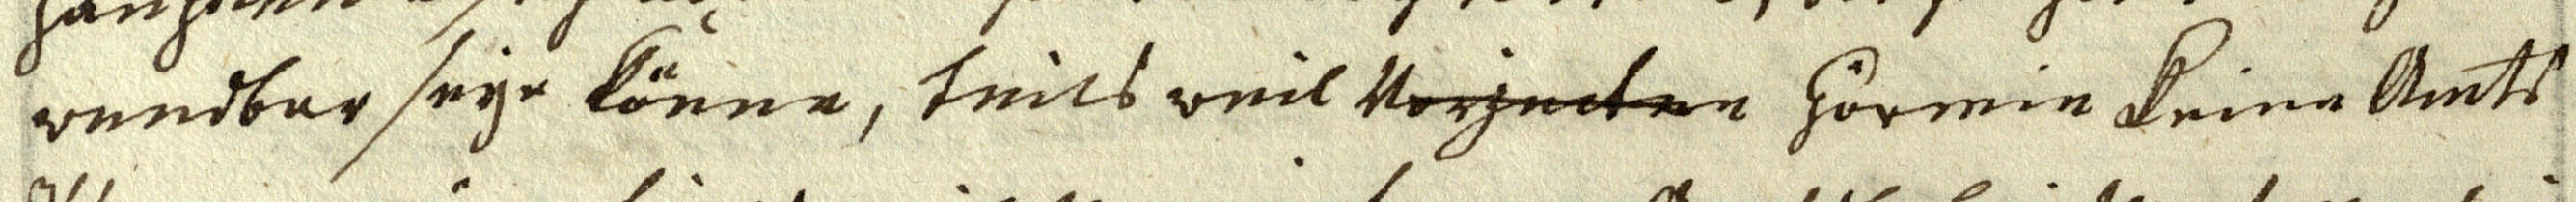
wendbar seÿn könne, theils weil Vorzeiten Görmin keine Amts¬
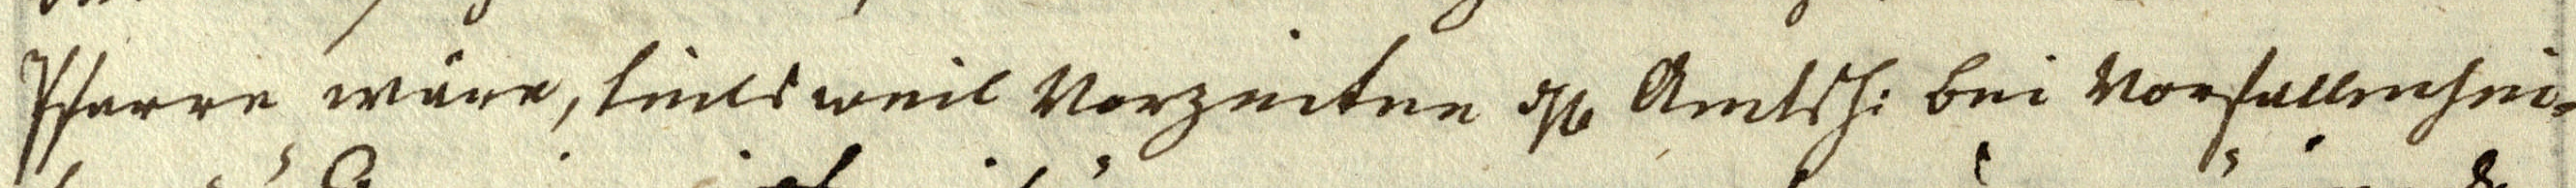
Pfarre wäre, theils weil vorzeiten dh Amtsh. bei Vorfallenhei¬
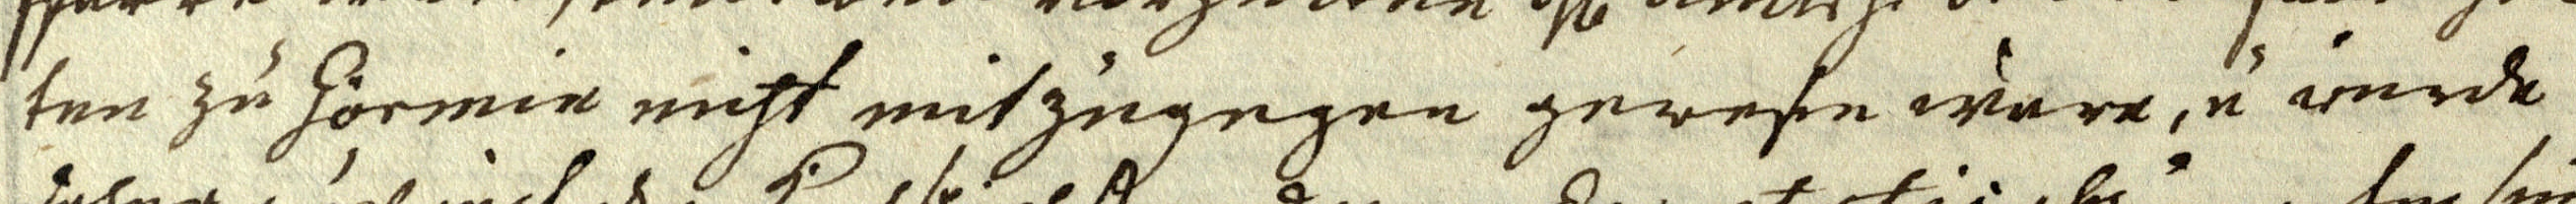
ten zu Görmin nicht mit zugegen gewesen wäre, u würde
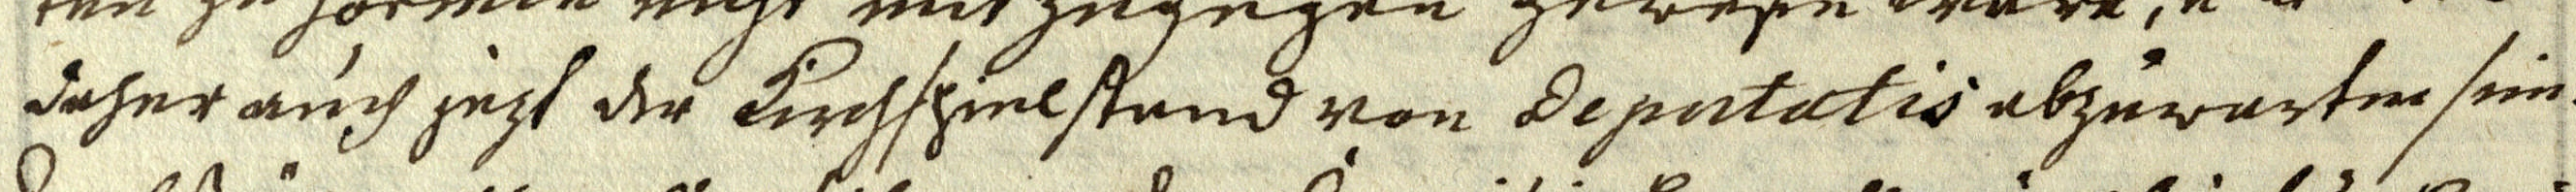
daher auch jezt der Kirchspielstand von Deputatis abzuwarten sein.
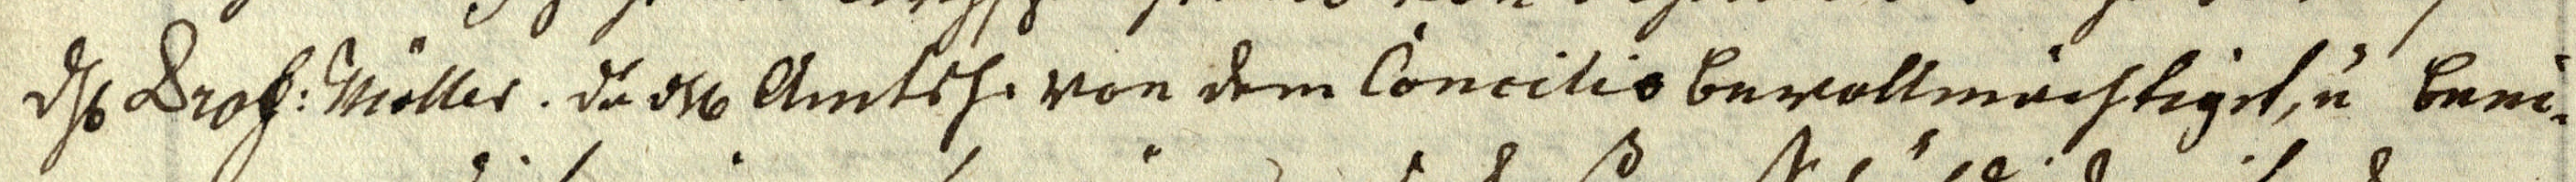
dh Prof. Möller. da dh Amtsh. von dem Concilio bevollmächtiget, u beei¬
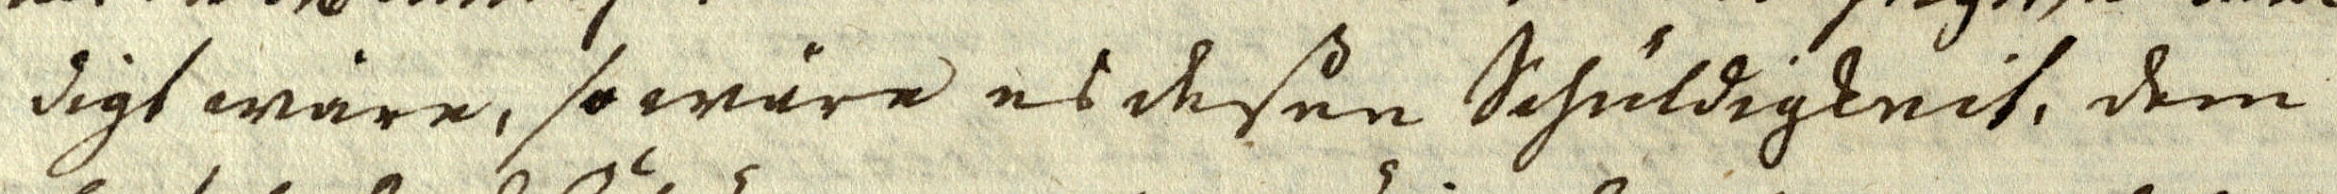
digt wäre, so wäre es dessen Schuldigkeit, dem
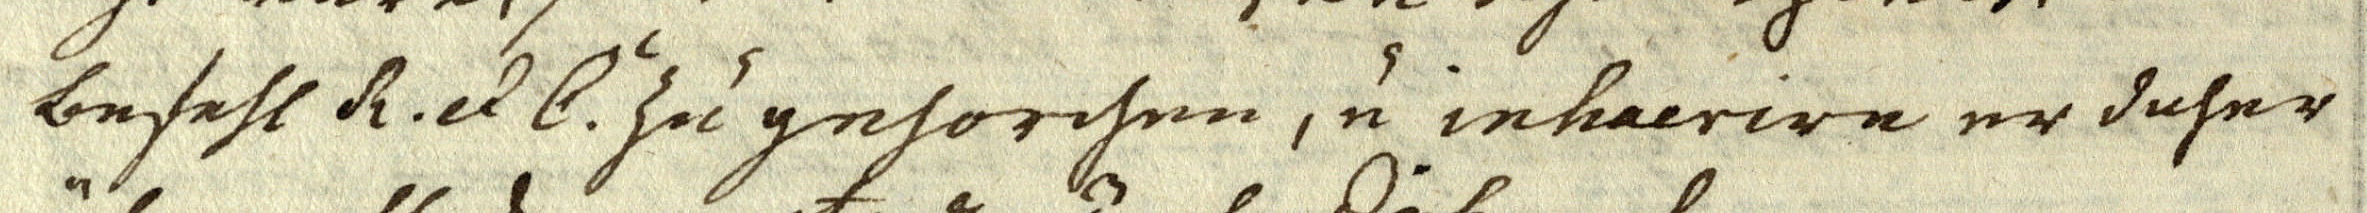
Befehl R. et C. zu gehorchen, u inhaerire er daher
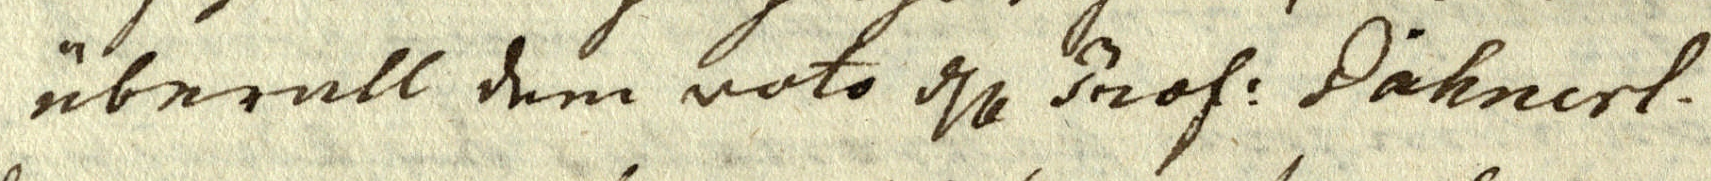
überall dem voto dh Prof. Dähnert.
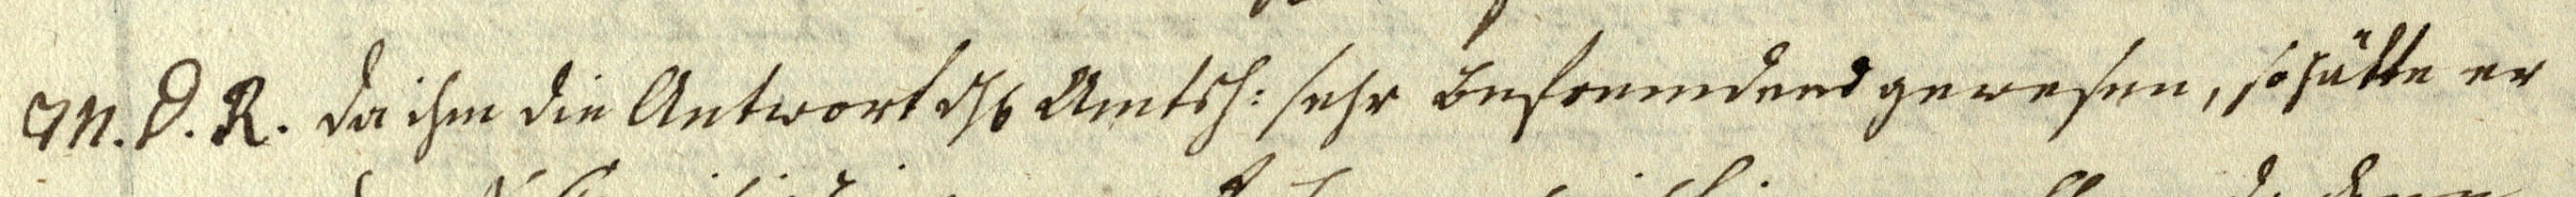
M. D. R. Da ihm die Antwort dh Amtsh. sehr befremdend gewesen, so hätte er
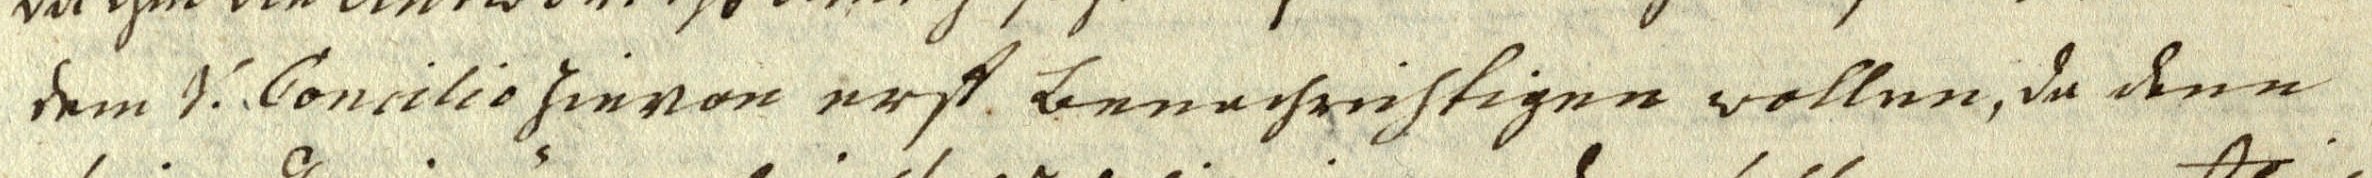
dem V. Concilio hievon erst benachrichtigen wollen, da denn
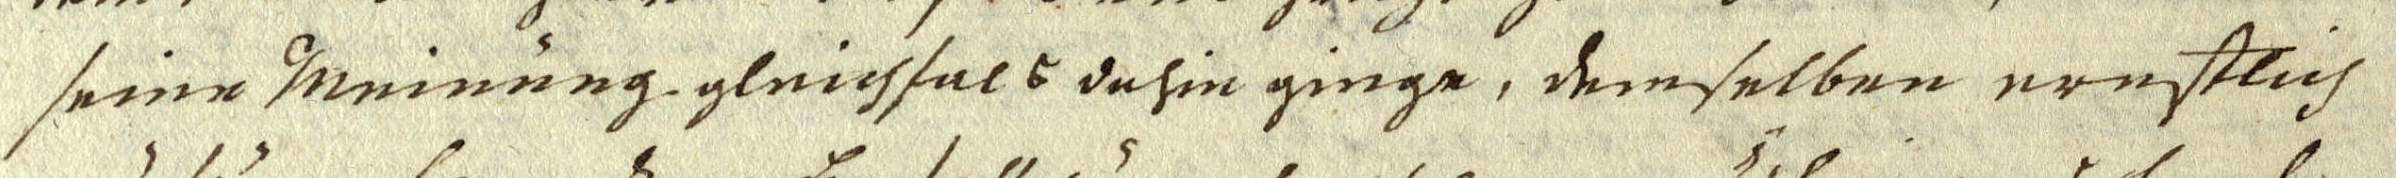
seine Meinung gleichfals dahin ginge, demselben ernstlich
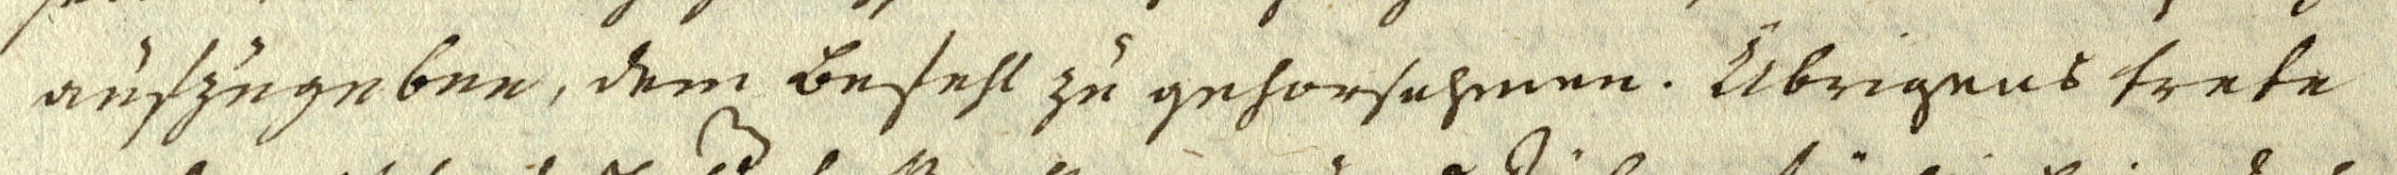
aufzugeben, dem Befehl zu gehorsahmen. Übrigens trete
